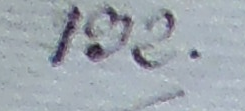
132.
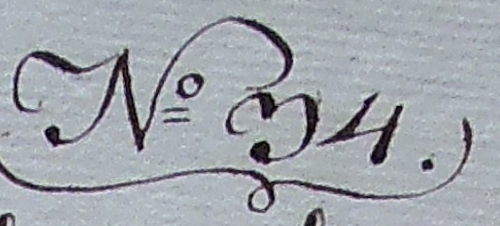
No͇ 34.
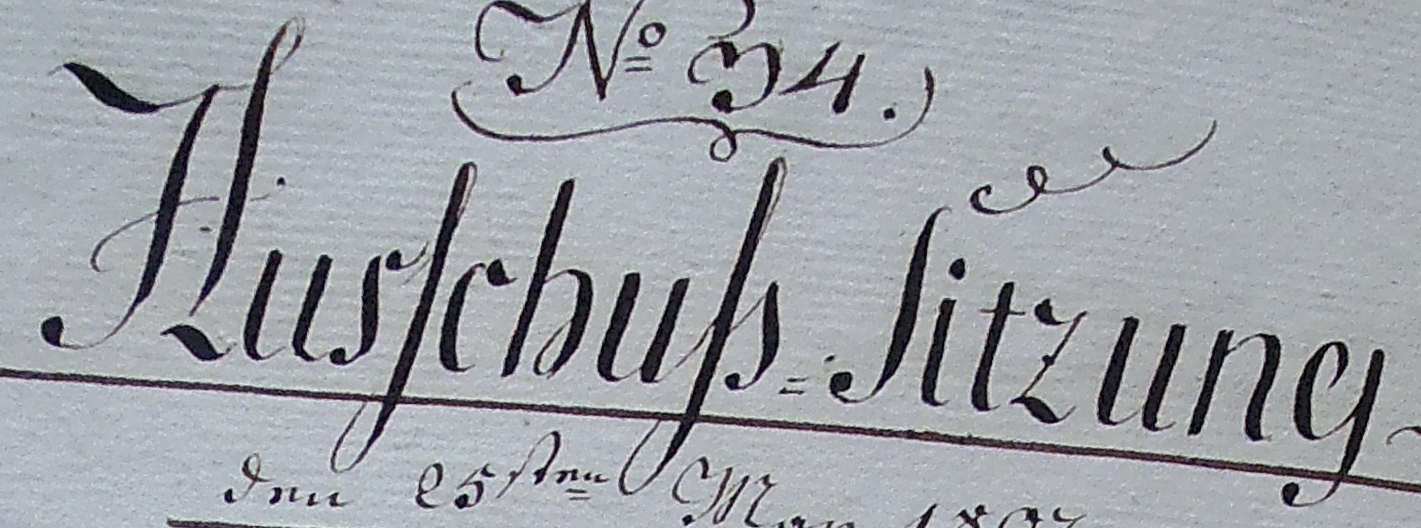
Ausschuss=Sitzung
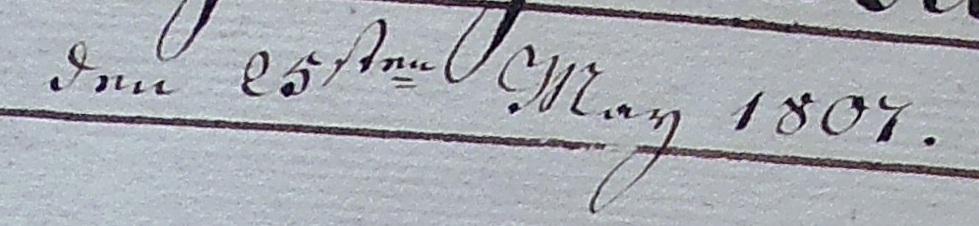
den 25ste͇n May 1807.
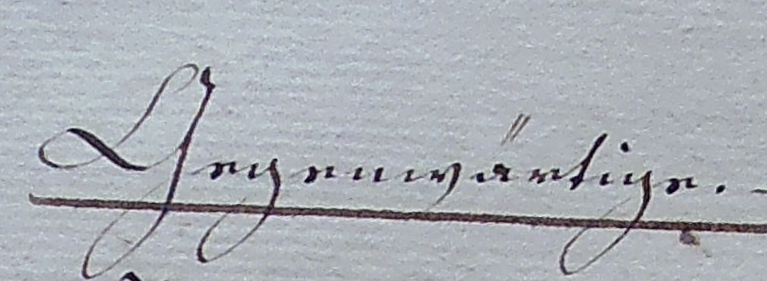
Gegenwärtige.
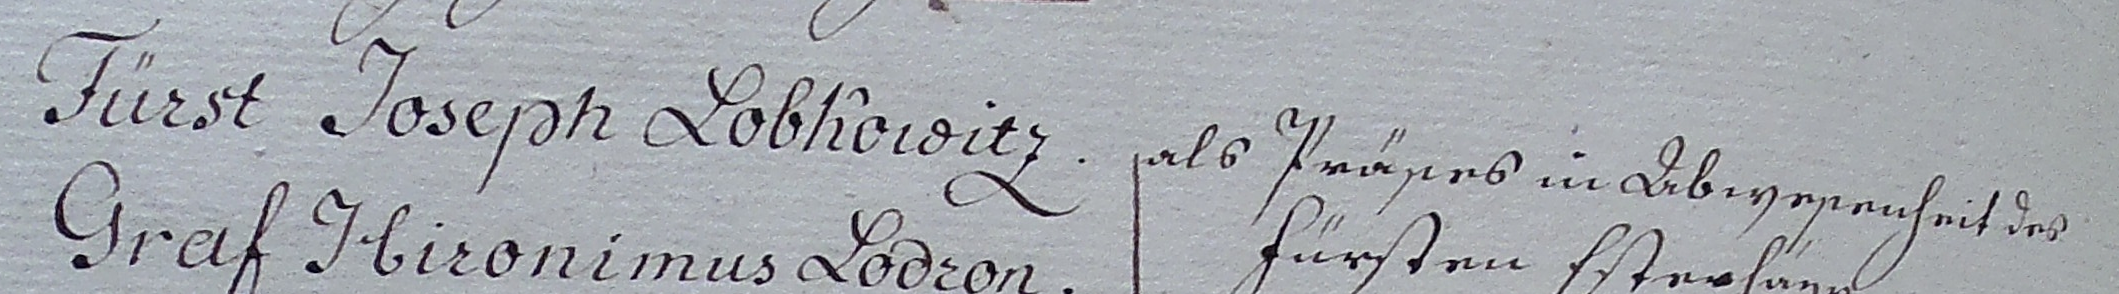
Fürst Joseph Lobkowitz als Präses in Abwesenheit des
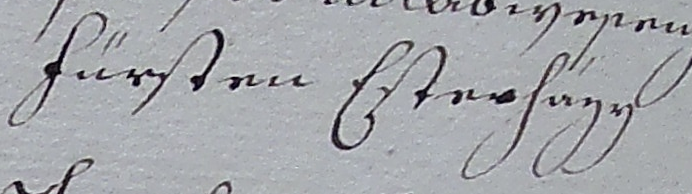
Fürsten Estertházy
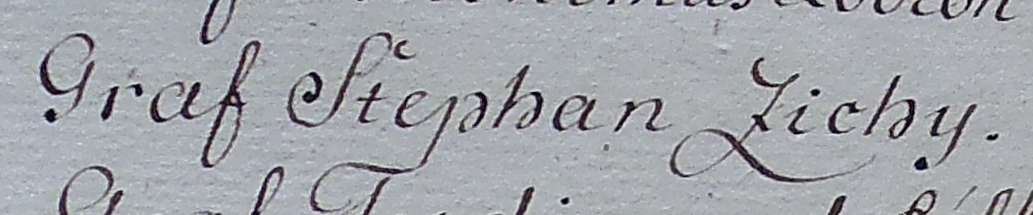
Graf Stephan Zichy.
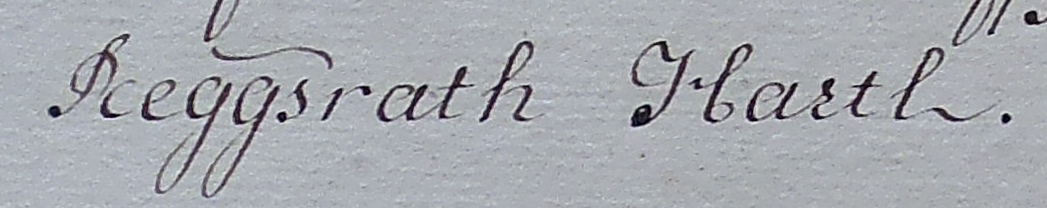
Reg͞gsrath Hartl.
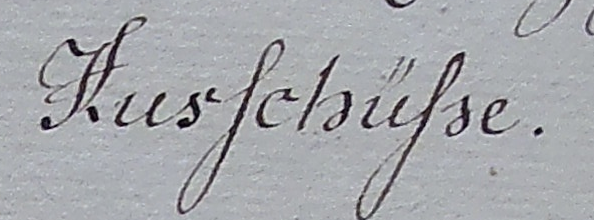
Ausschüsse.
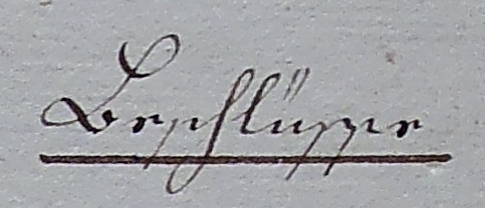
Beschlüsse.
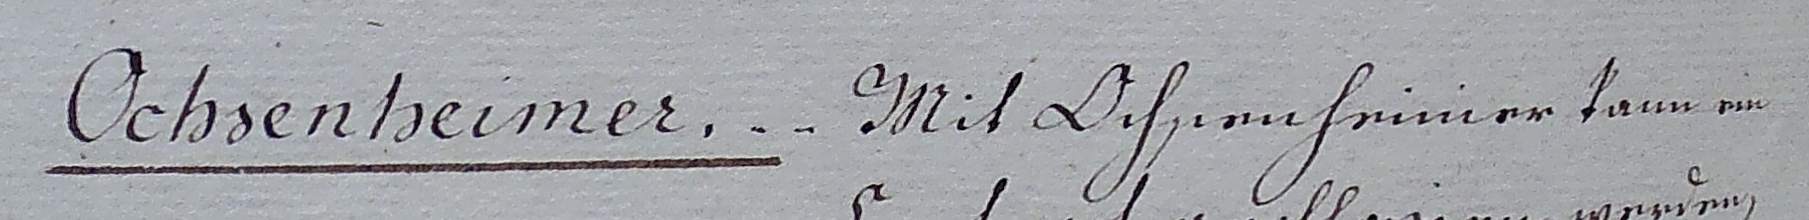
Ochsenheimer. . .. Mit Ochsenheimer kann ein
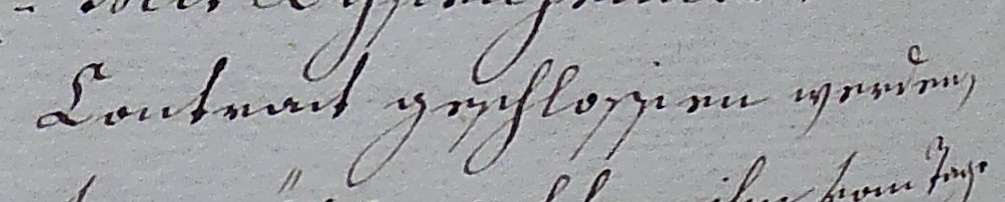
Contract geschlossen werden,
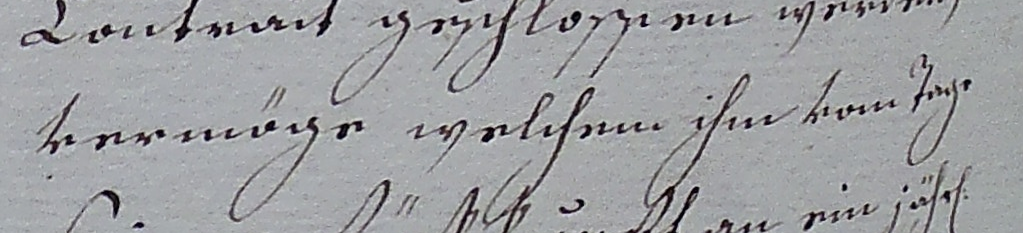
vermöge welchen ihm vom Tage
